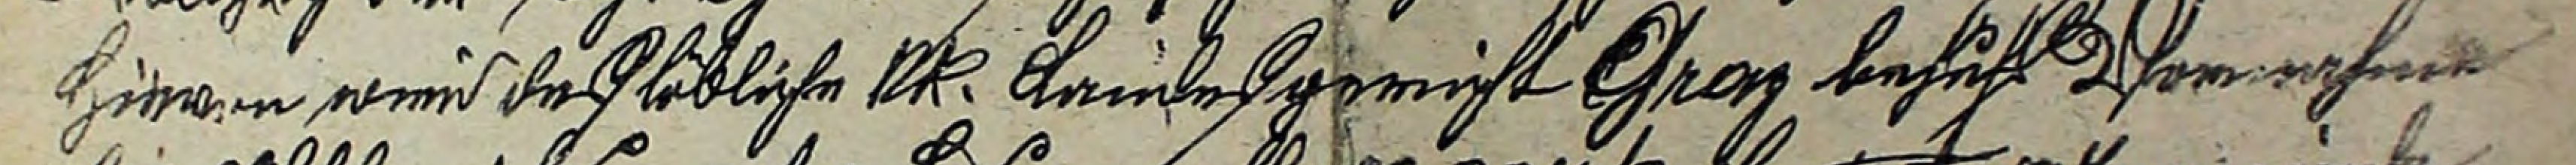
Hievon wird das löbliche kk. Landesgericht Graz behufs Vornahme
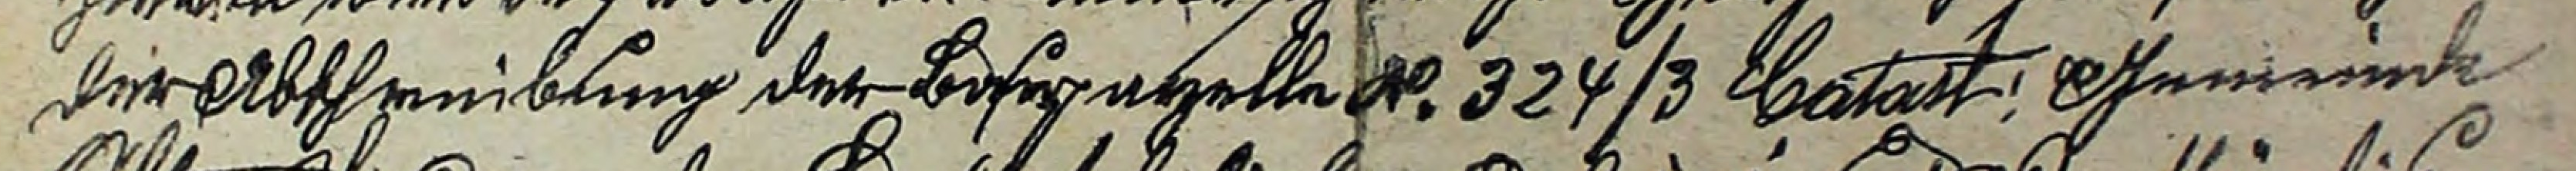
der Abschreibung der Bauparzelle No 324/3 Catast: Gemeinde
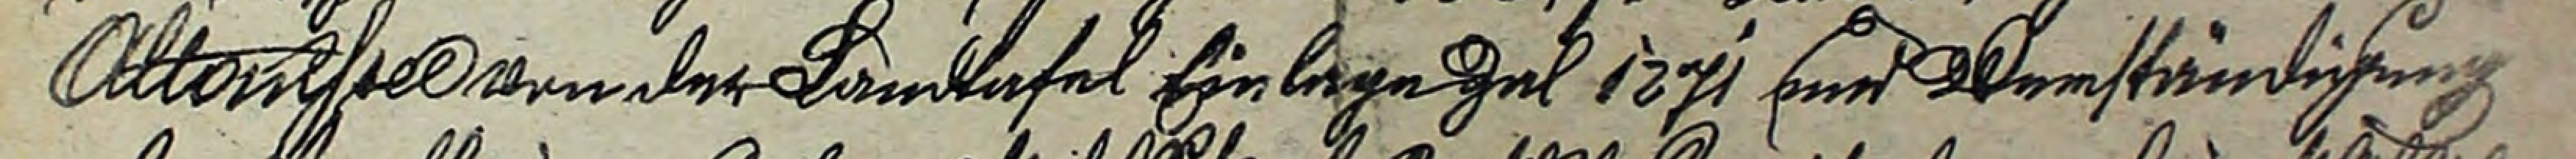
Altaussee von der Landtafel Einlage Zal 1271 und Verständigung
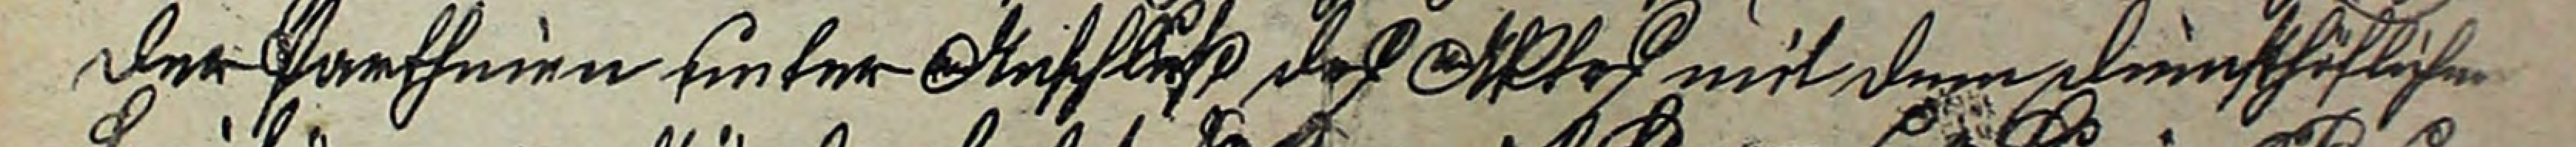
der Partheien unter Anschluss des Aktes mit dem Diensthöflichen
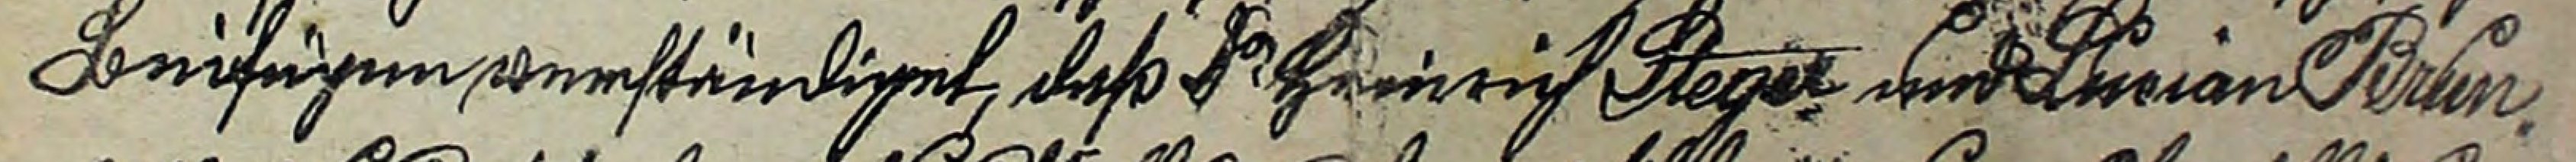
Beifügen verständiget, daß Dr Heinrich Steger und Lucian Brun„
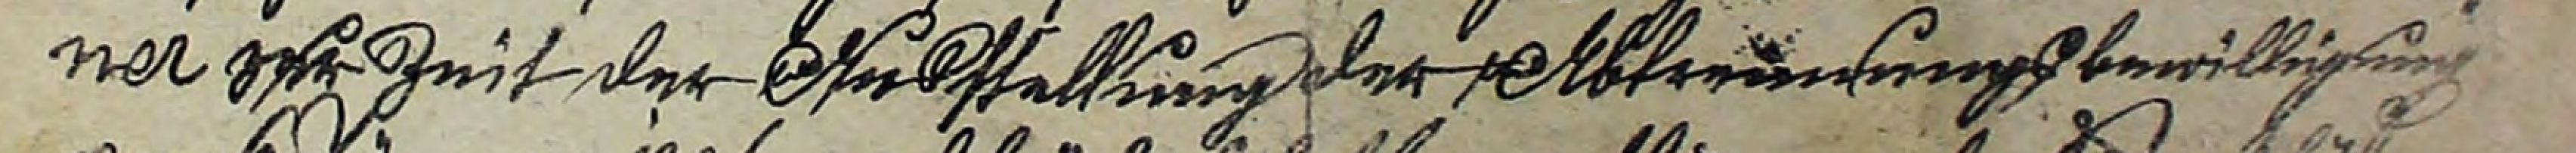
ner zur Zeit der Ausstellung der Abtrennungsbewilligung
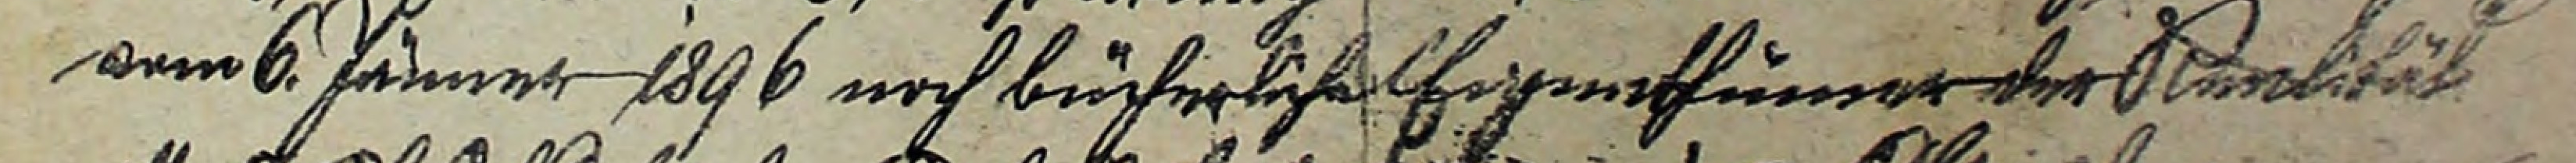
am 6. Jänner — 1896 noch bücherliche Eigenthumer der Realität
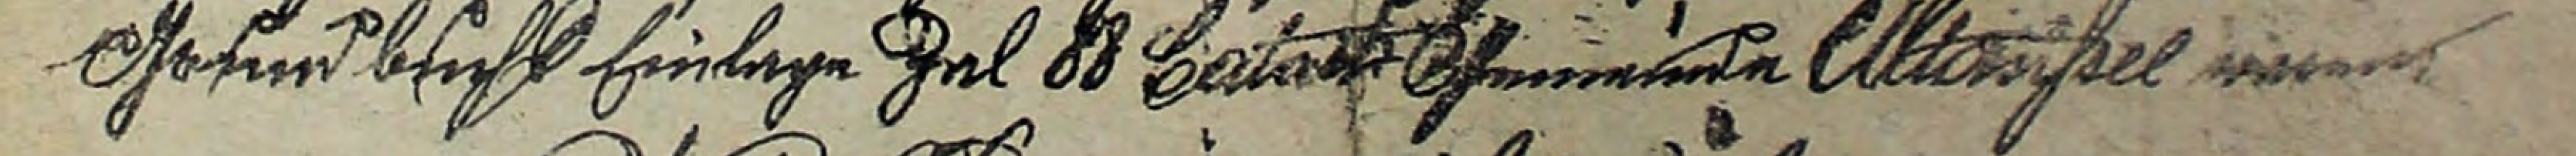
Grundbuchs Einlage Zal 88 Catast. Gemeinde Altaussee einem
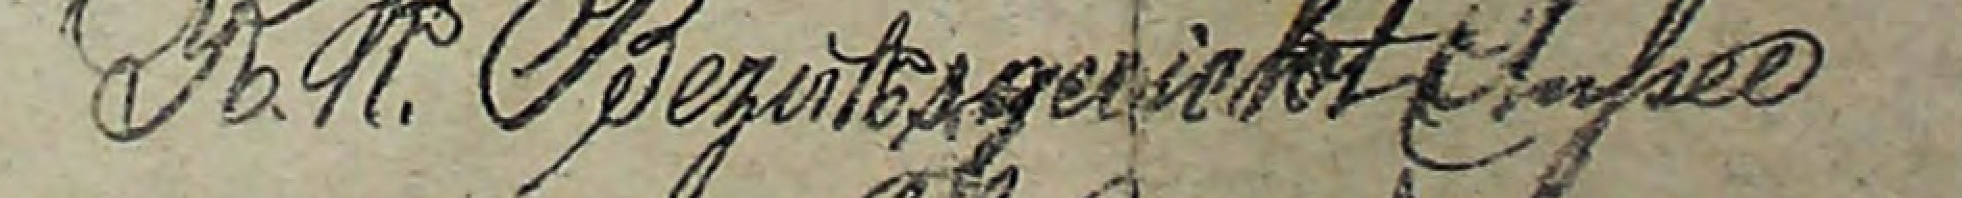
k.k. Bezirksgericht Aussee
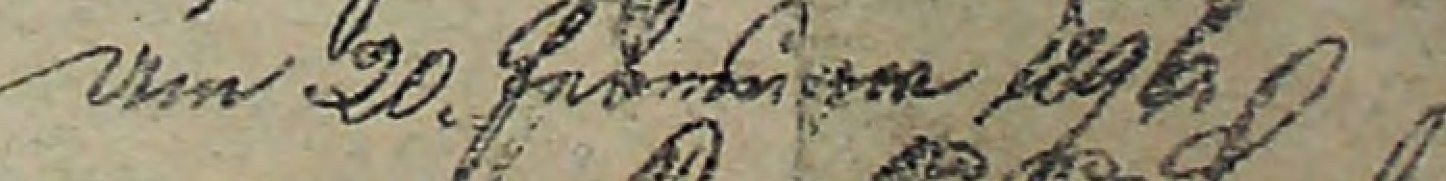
am 20. Februar 1896.
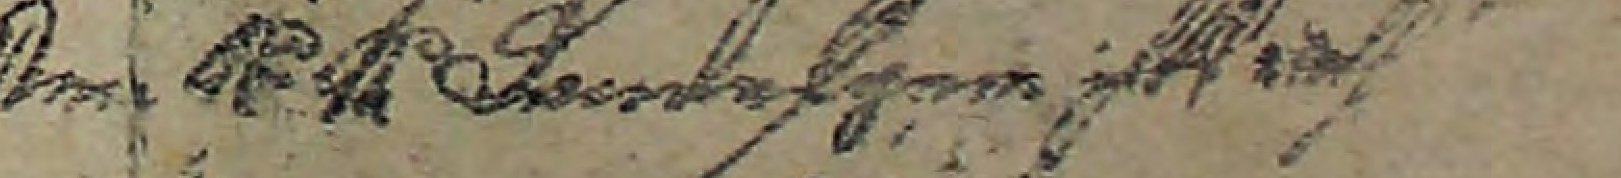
Der k.k Sandergerichtsrecht
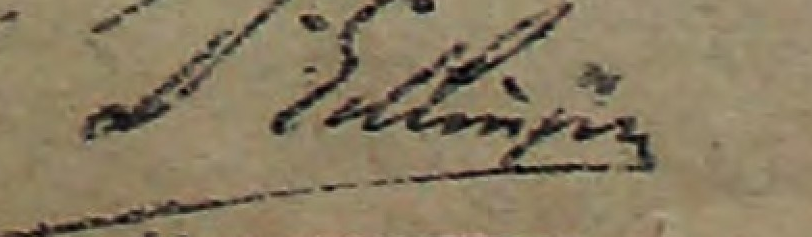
S. Edlingen
